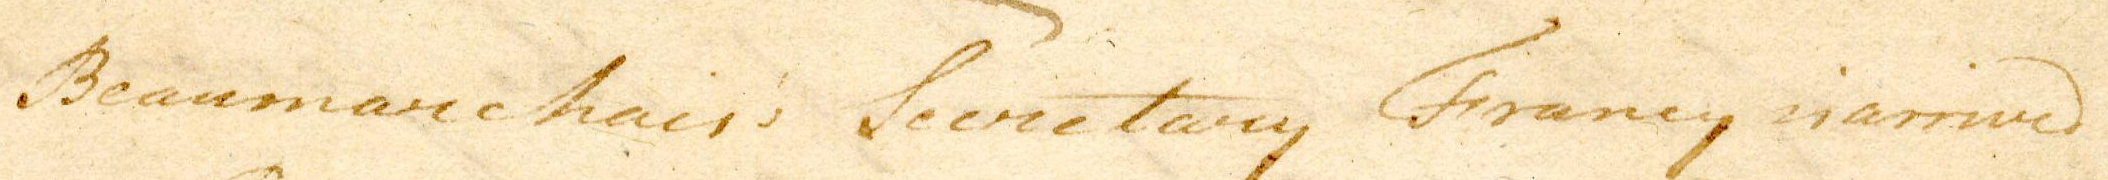Beaumarchais's Secretary Francey is arrived
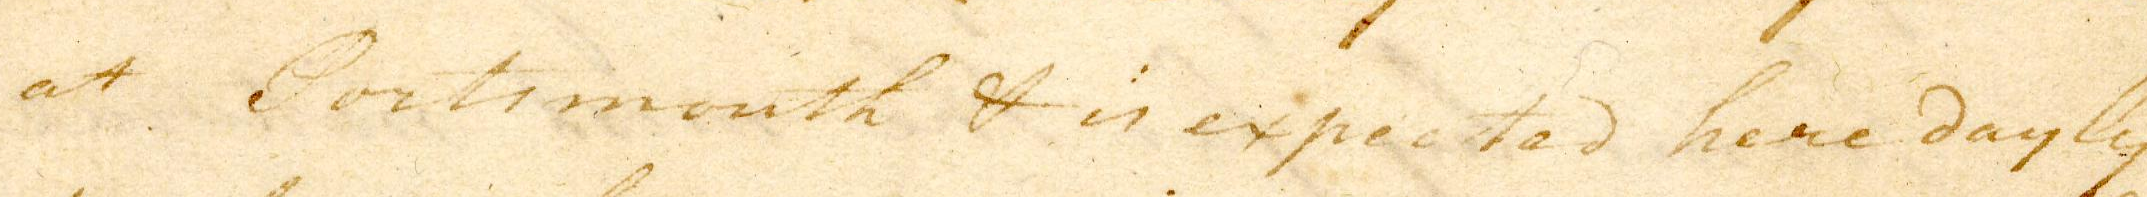at Portsmouth & is expected here dayly
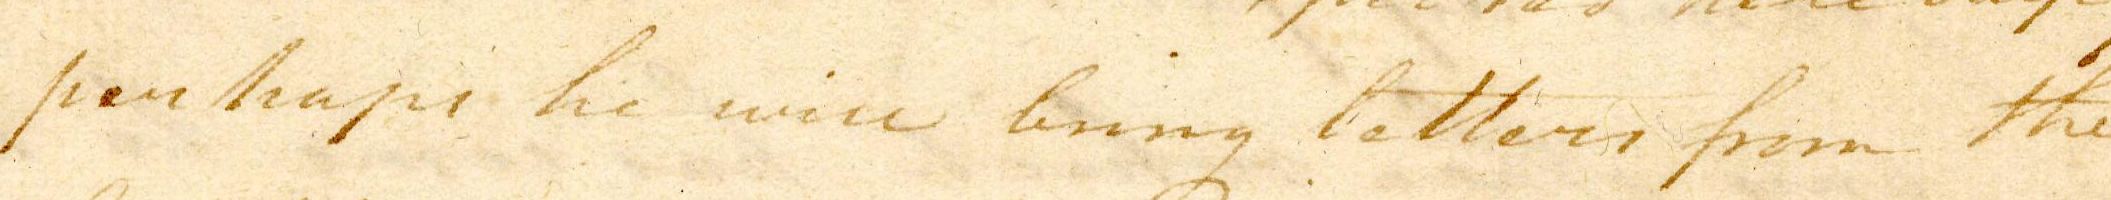perhaps he will bring letters from the
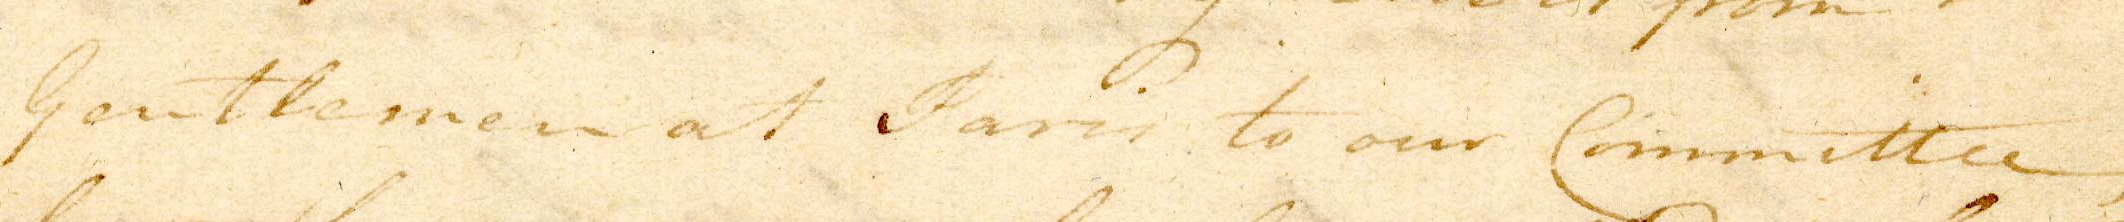Gertlemen at Paris to our Committee
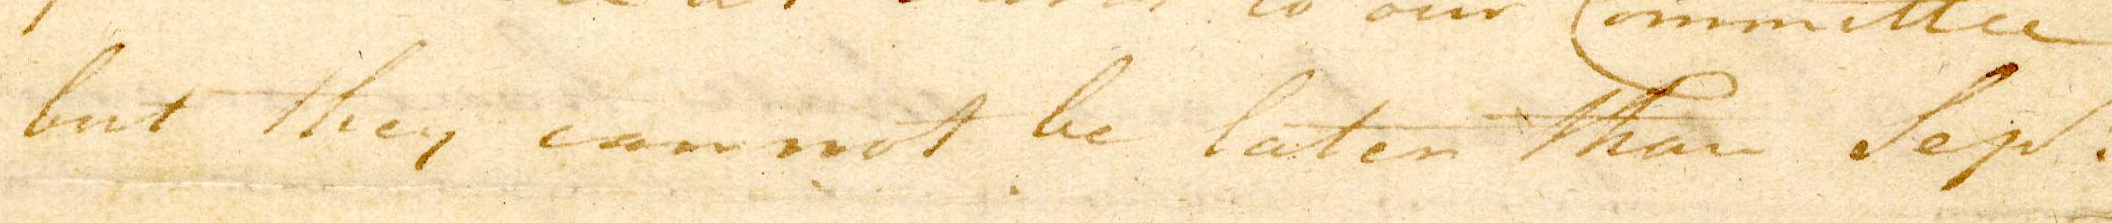but they cannot be later than Sep^r.
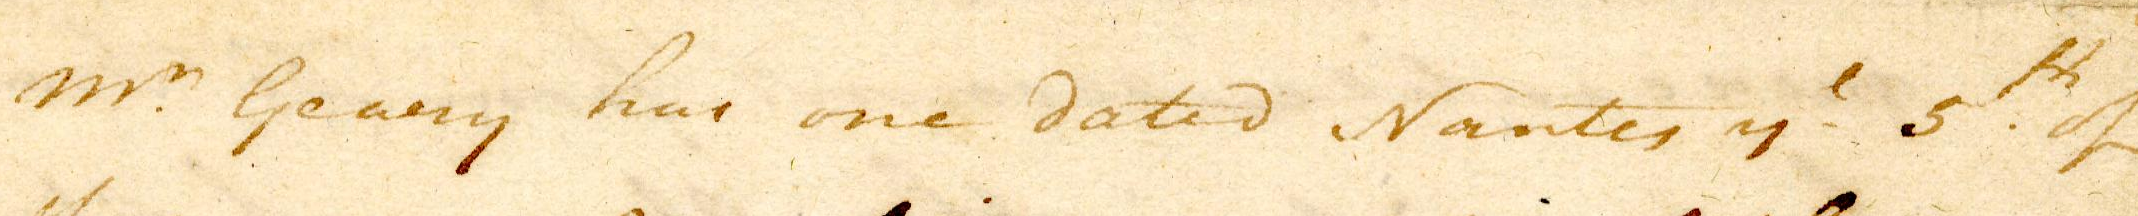M^r. Geary has one dated Nantes y^e 5^th. of
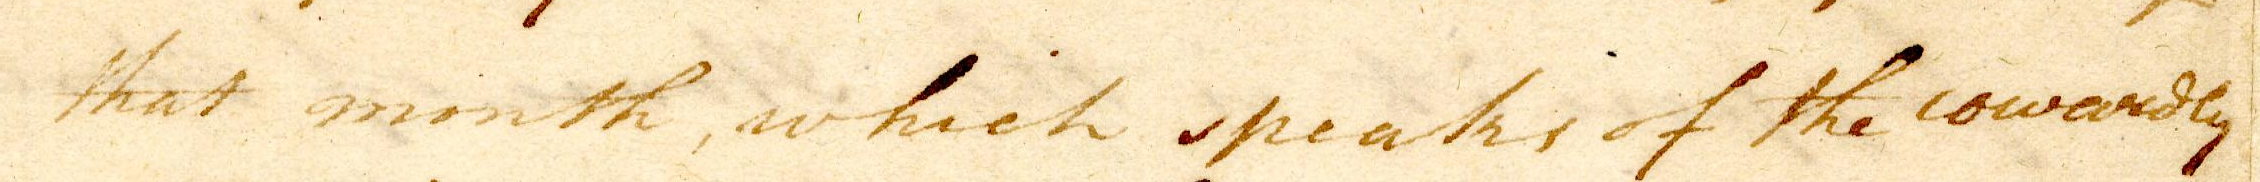that month, which speaks of the cowardly
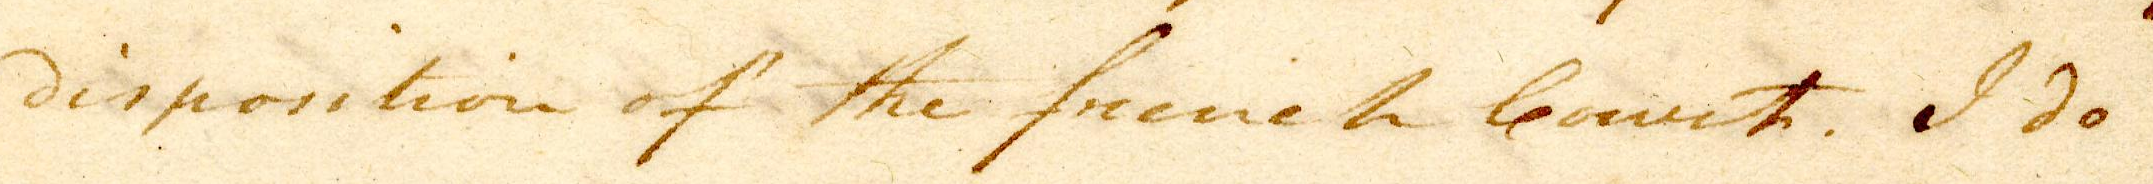disposition of the french Cavits. I do
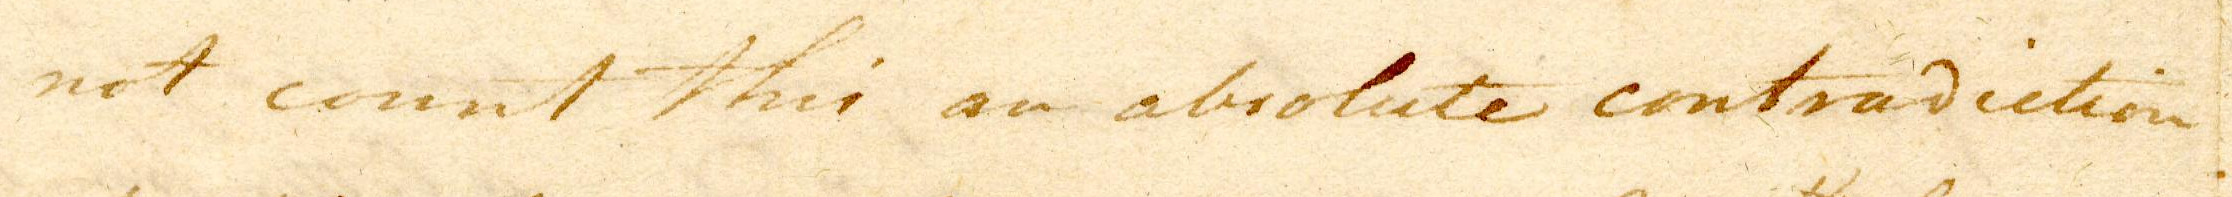not count this an absolute contradiction
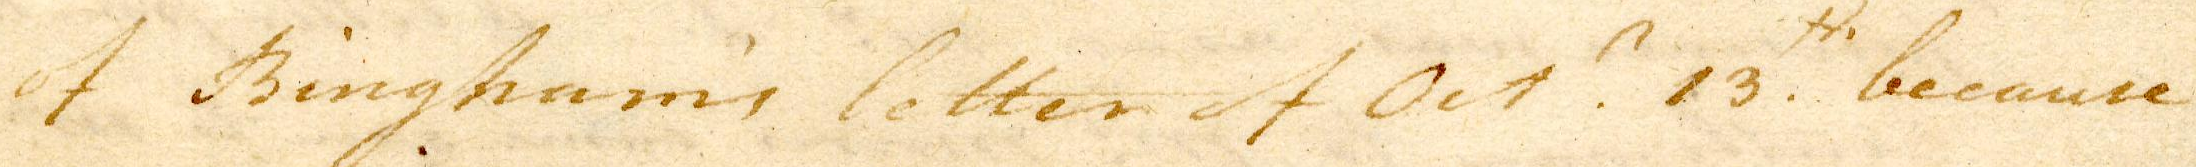of Binghams letter of Oct^r. 13^th. because
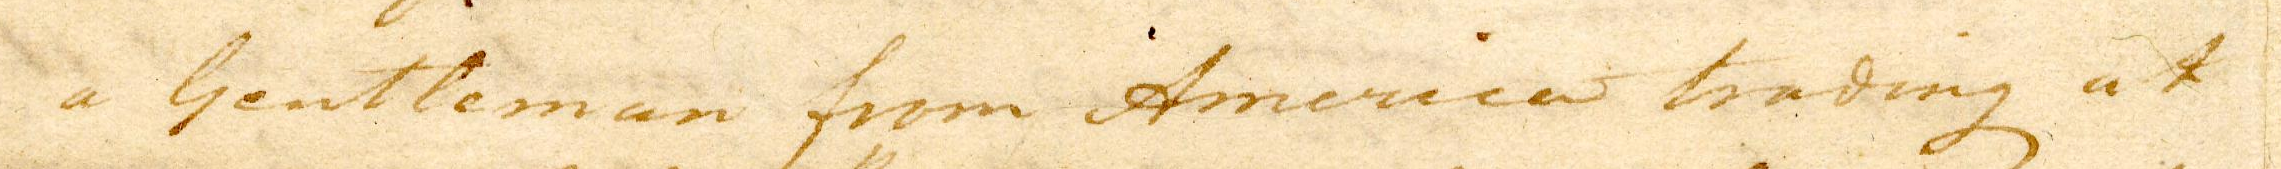a Gentleman from America trading at
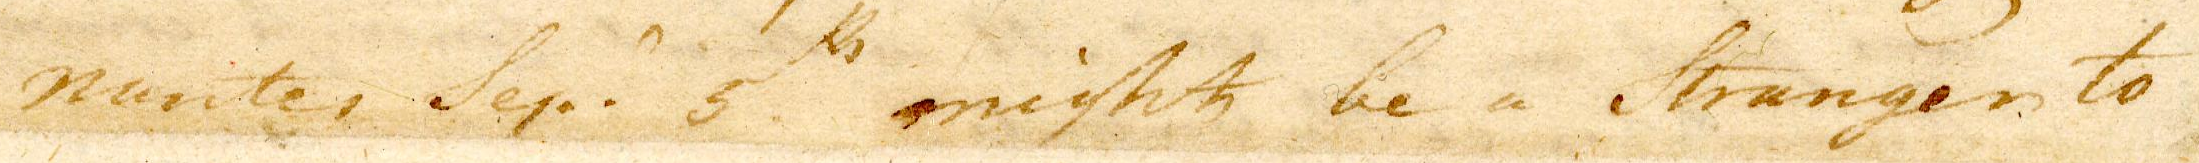Nantes Sep. 5 might be a Stranger to
